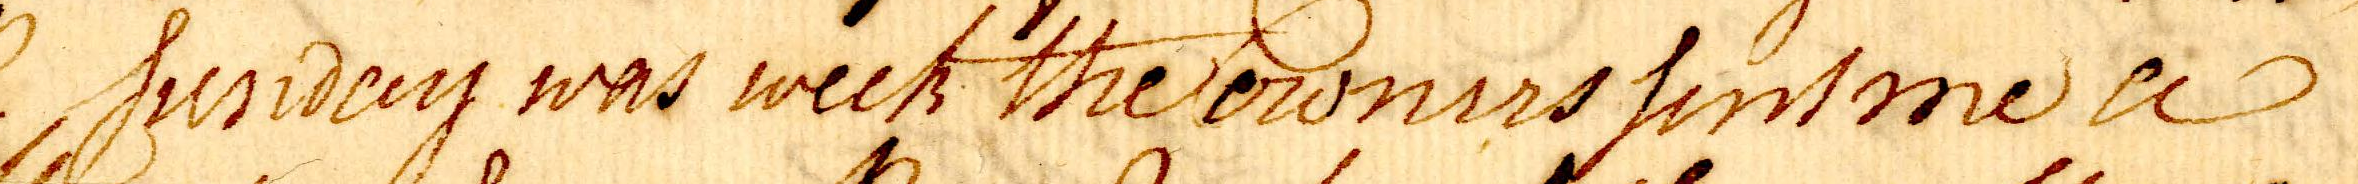Tuesday was week the owners sent me a
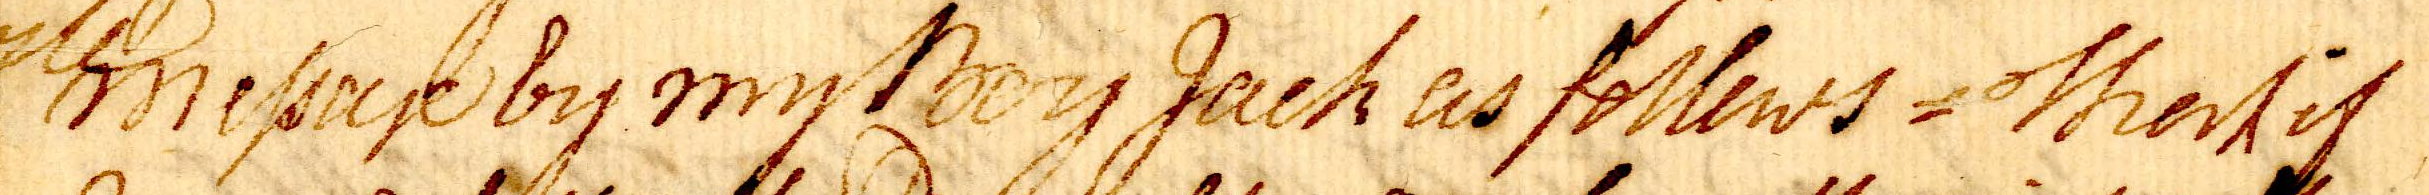Message by my Boy Jack as follows. That if
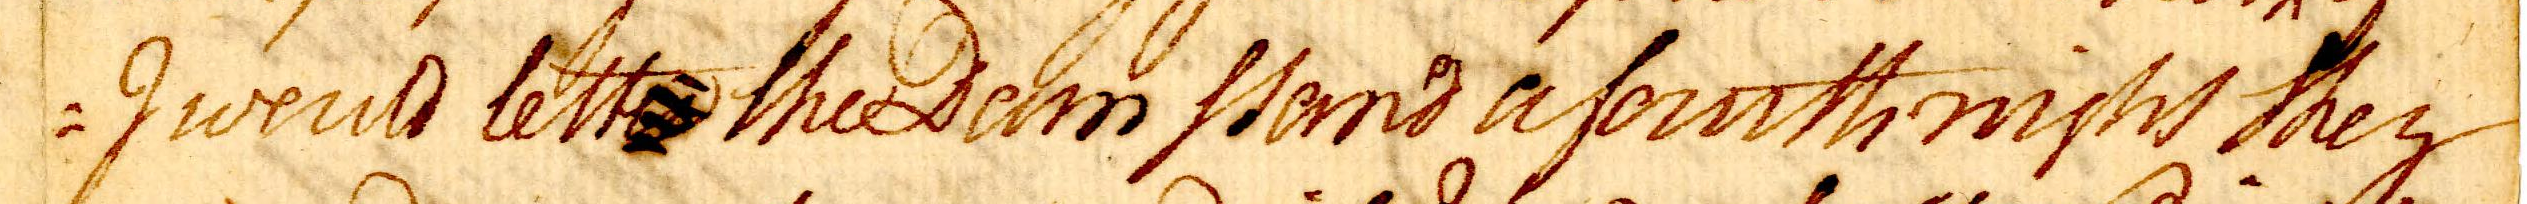I would lett the Dam stand a fourth night they
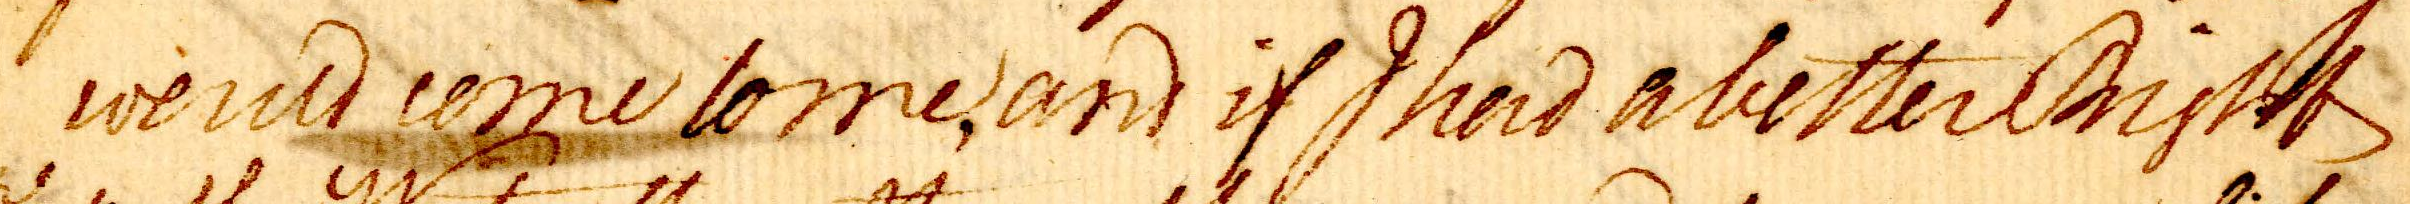would come to me, and if I had a better night
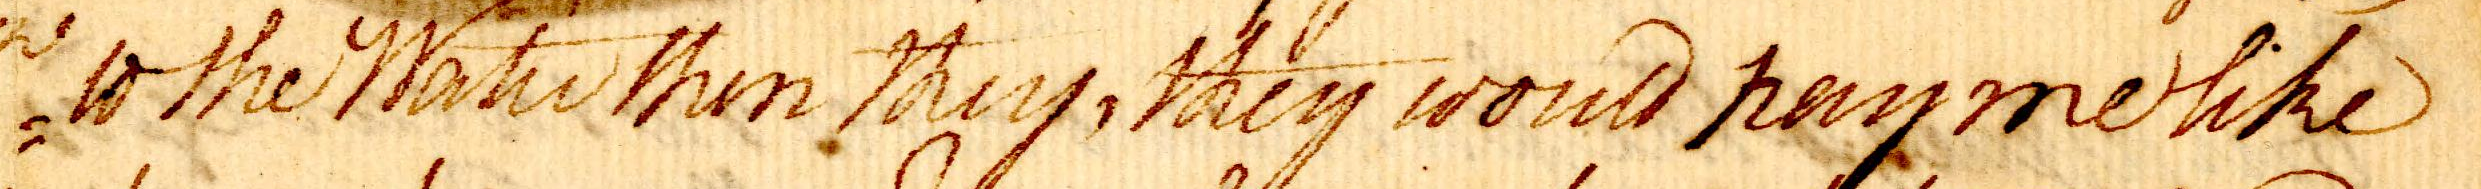to the Water then they, they would pay me like
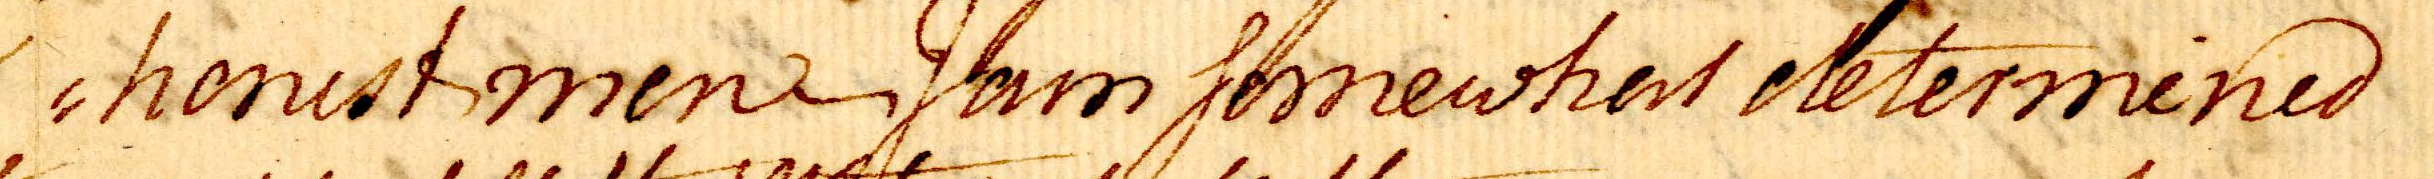honest men. I am somewhat determined
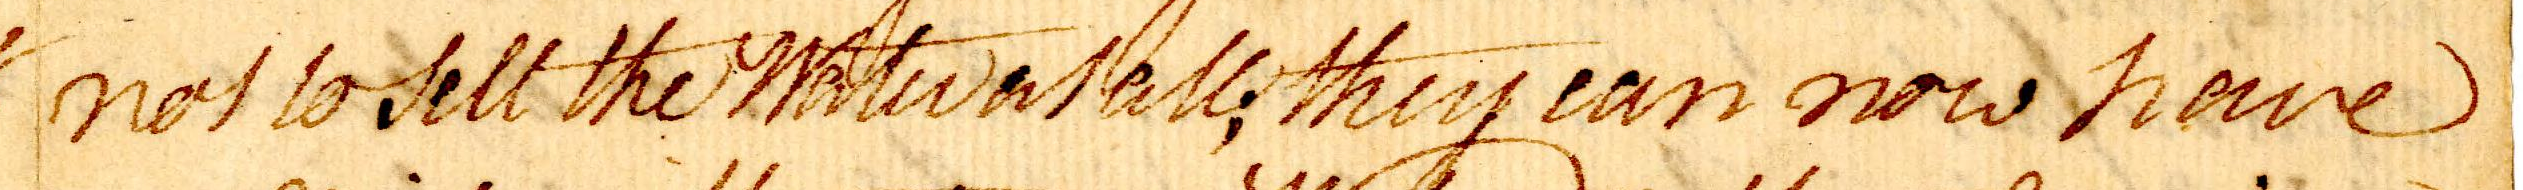not to sell the Water at all, they can now have
